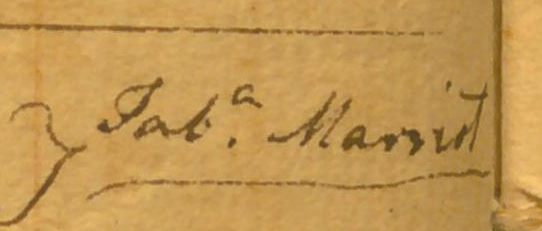Jab^a. Marriot
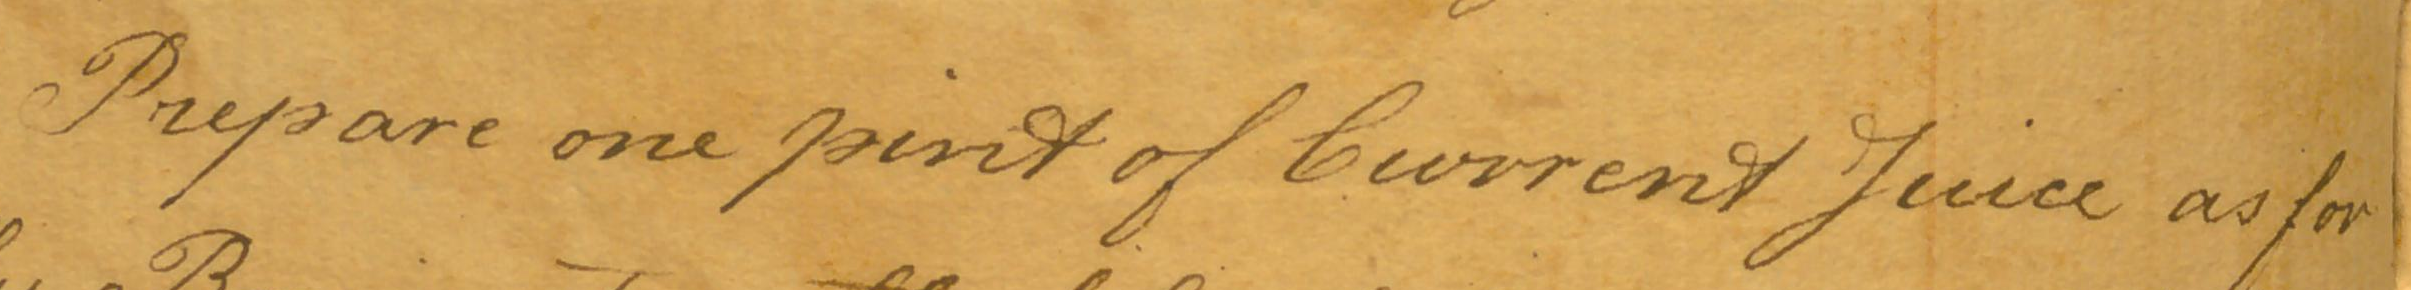Prepare one pint of Current Juice as for
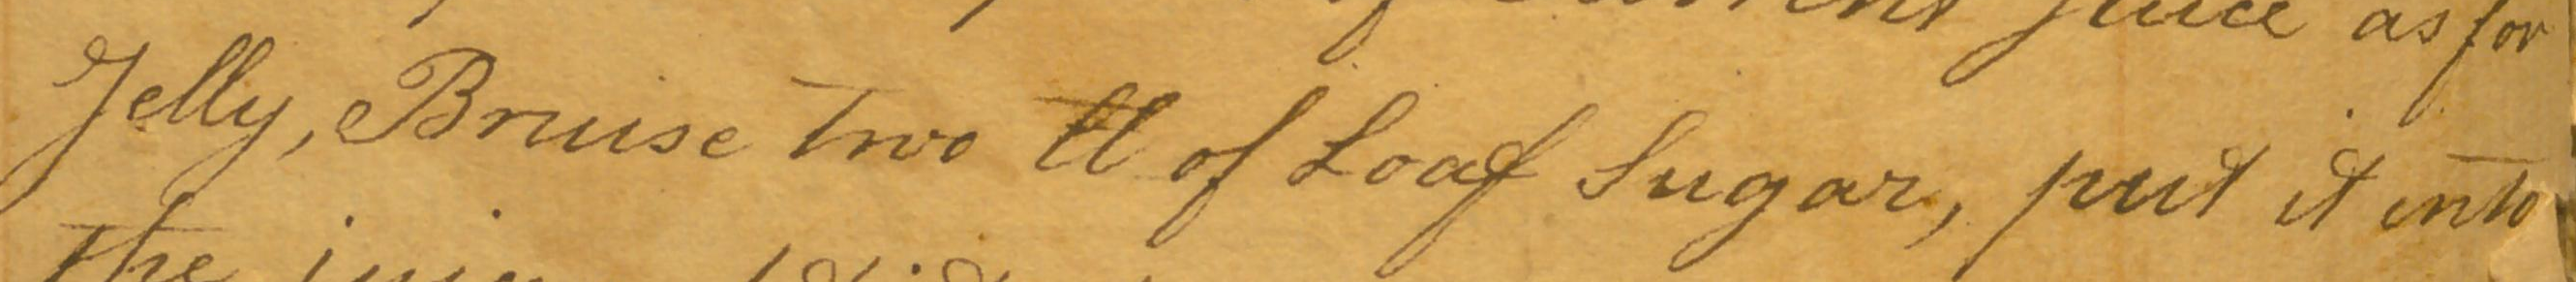Jelly, Bruise two lb of Loaf sugar, put it into
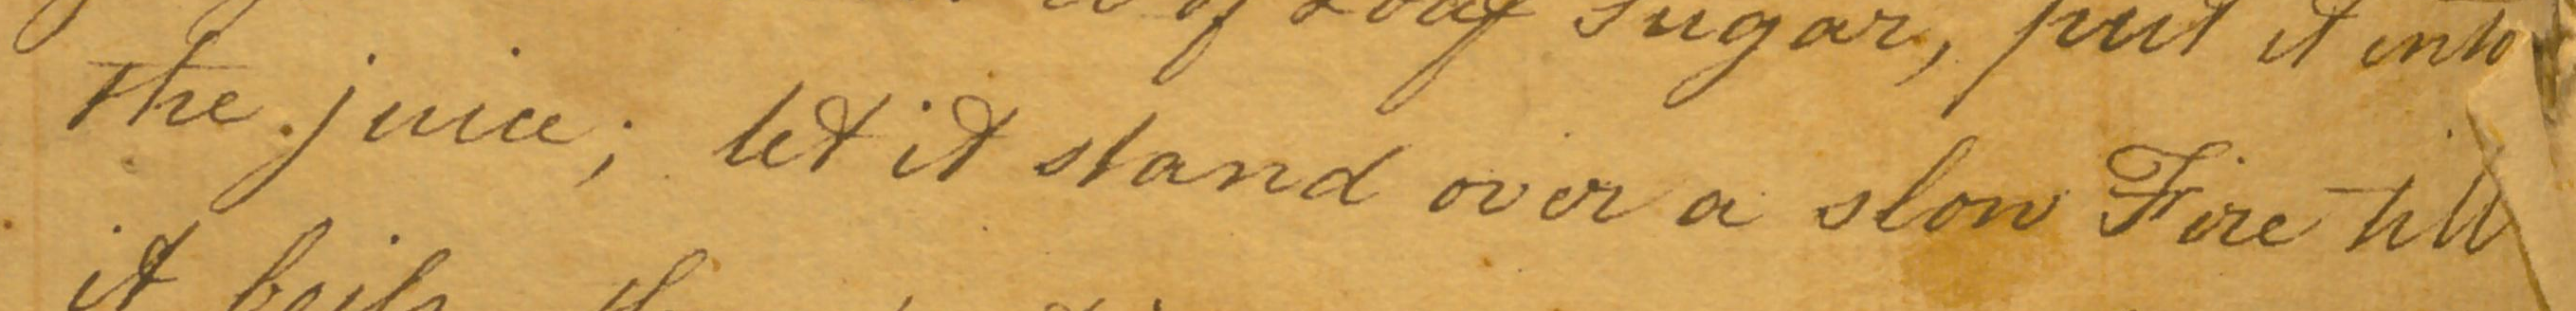the juice; let it stand over a slow Fire till
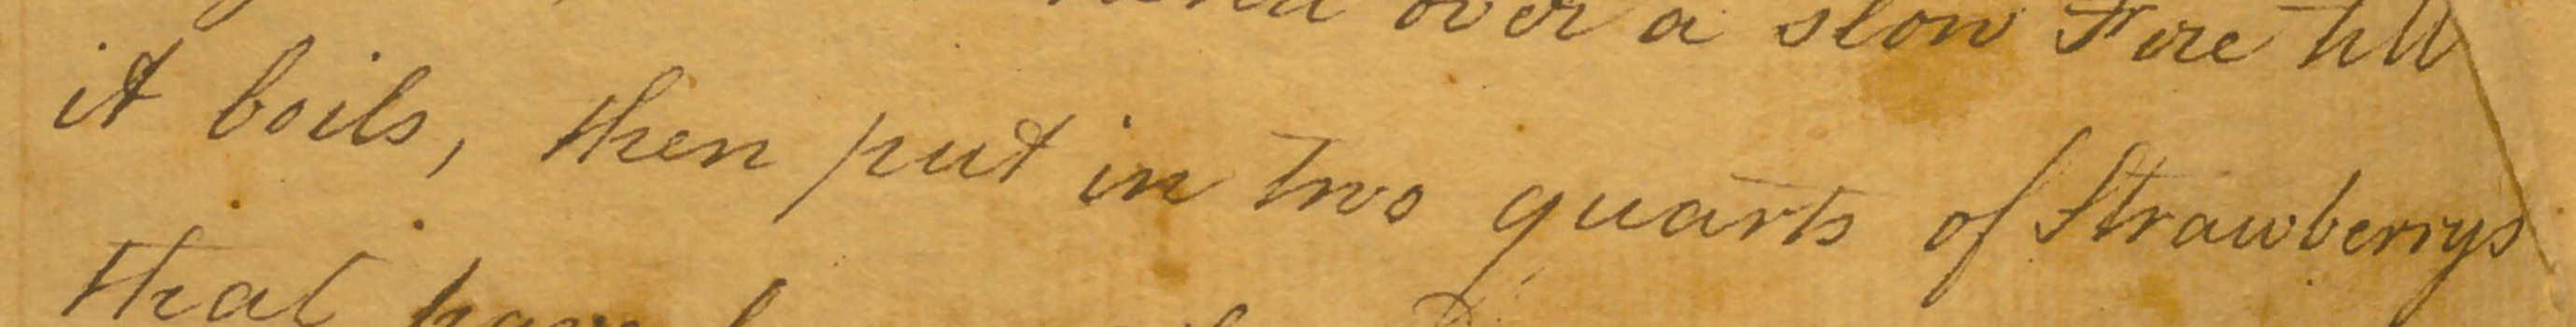it boils, then put in two quarts of strawberrys
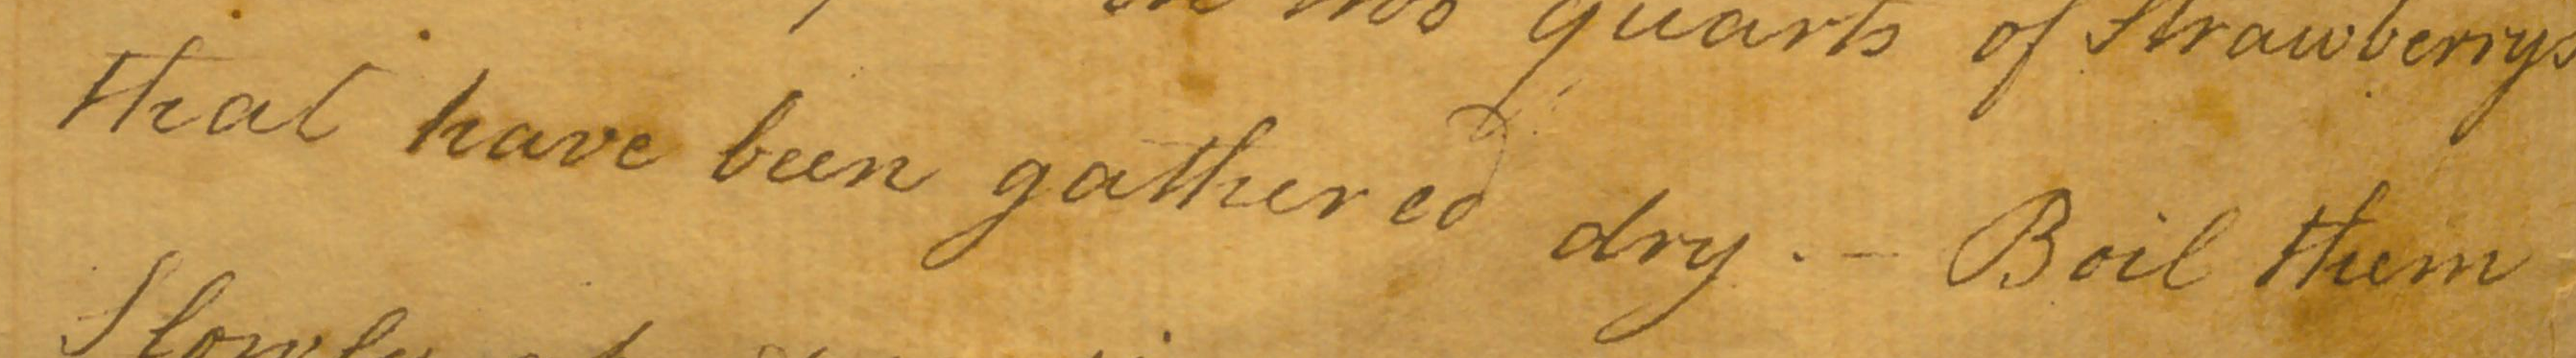that have been gathered dry.- Boil them
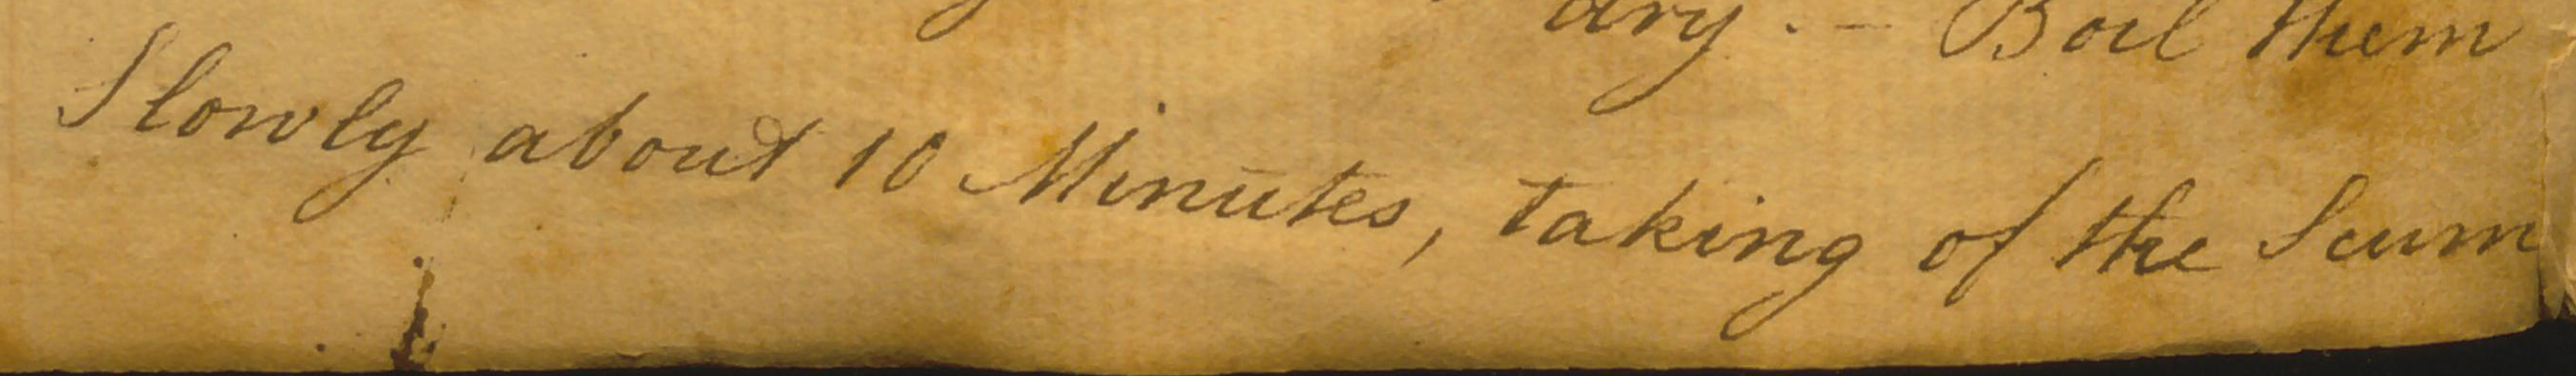slowly about 10 Minutes, taking of the scum
